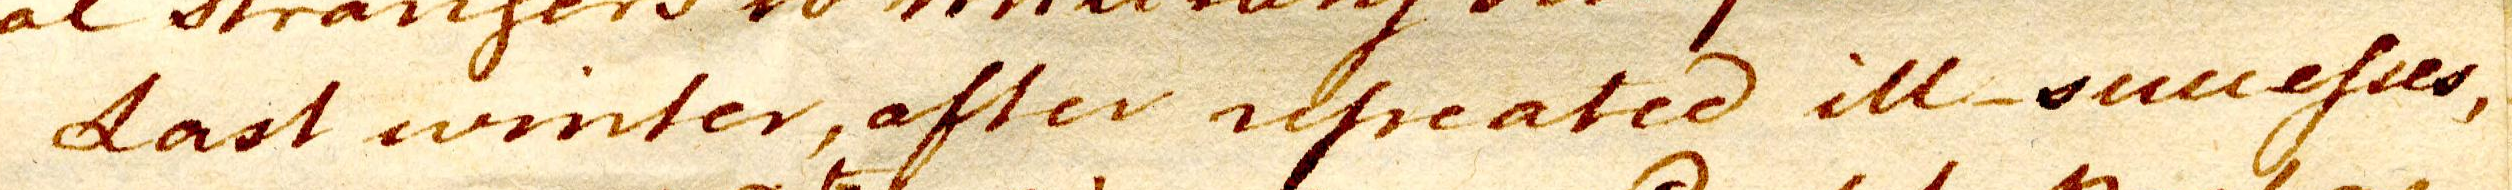Last winter, after repeated ill-successes,
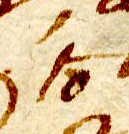to
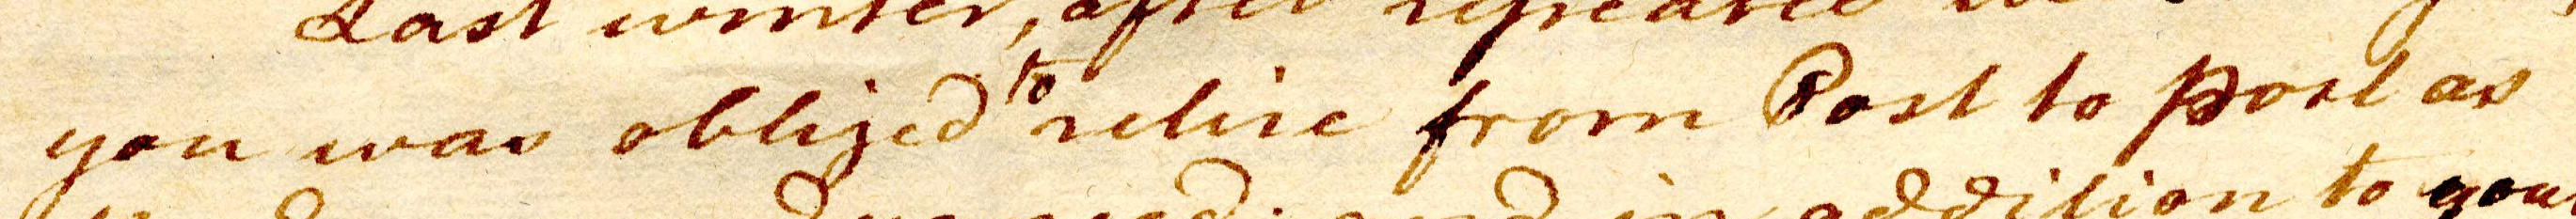you was obliged retire from Post to post as
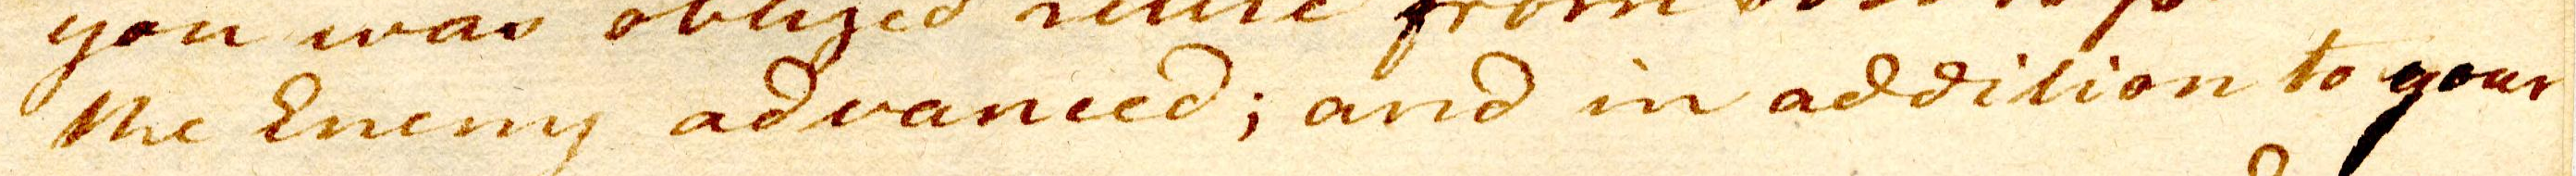the Enemy advanced; and in addition to your
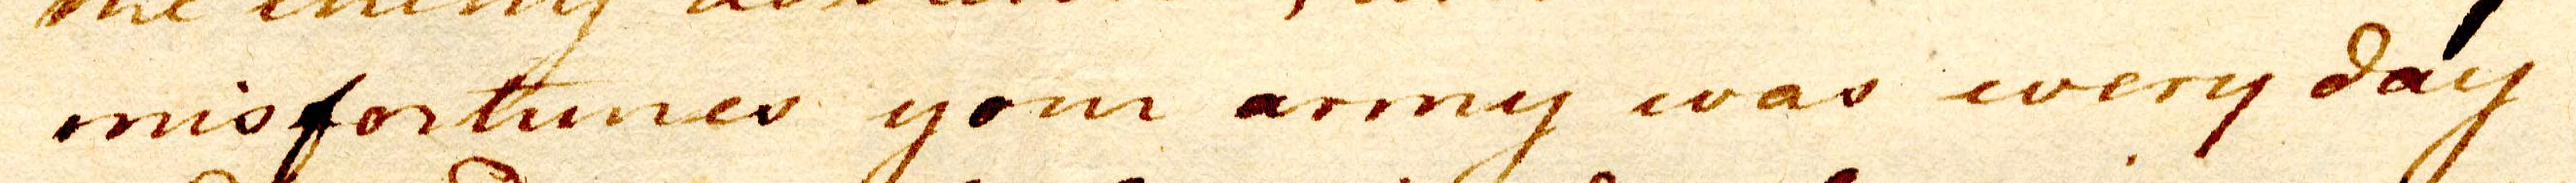misfortunes your army was every day
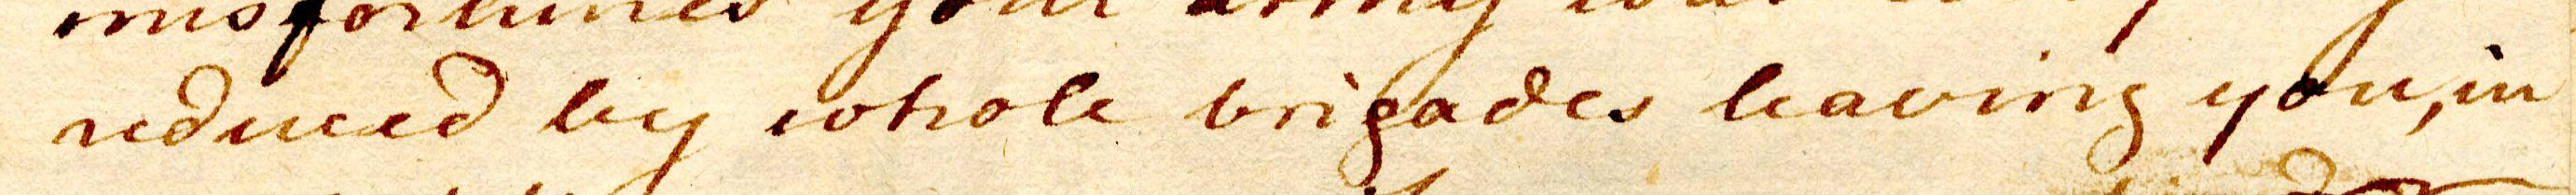reduced by whole brigades leaving you, in
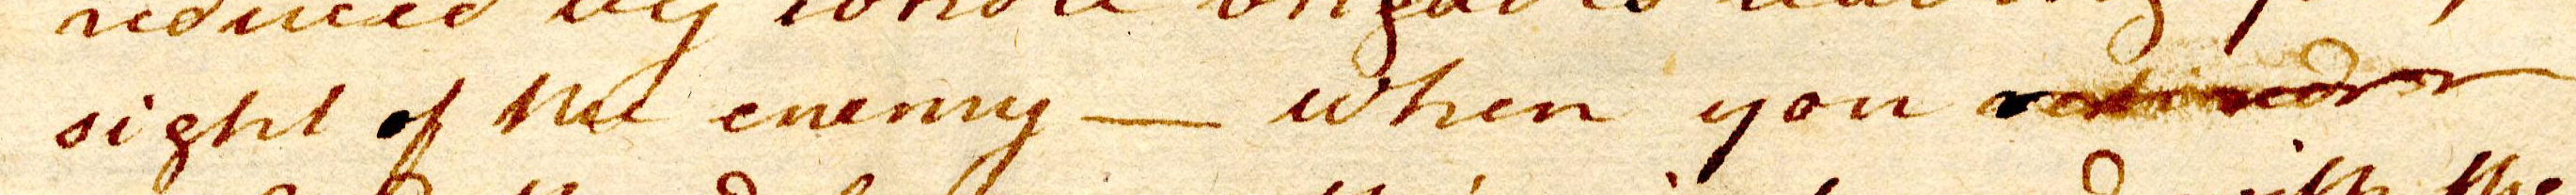sight of the enemy- when you [_____]
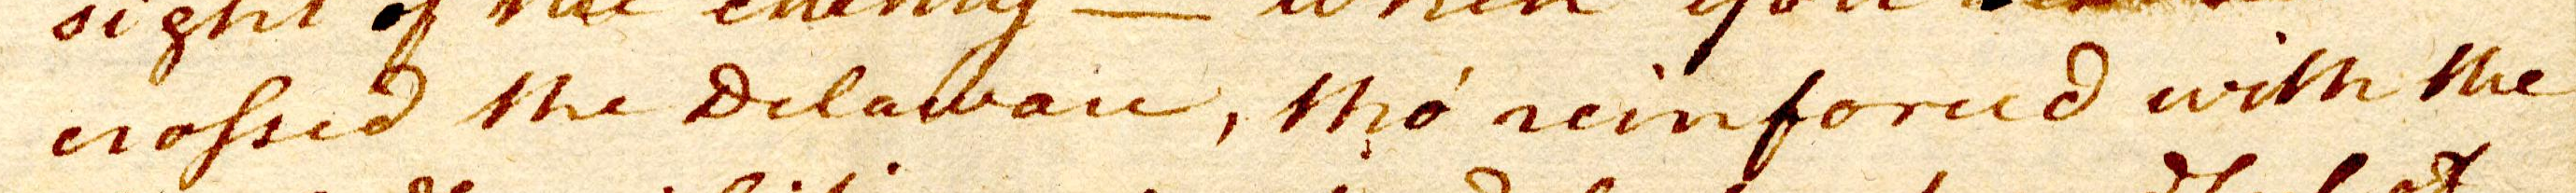crossed the Delaware, tho' reinforced with the
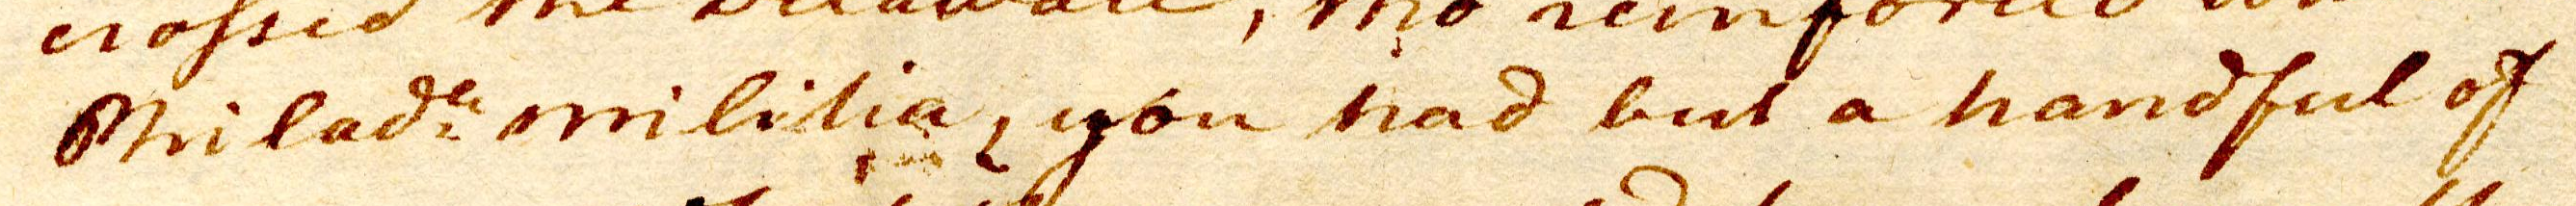Philad^a. militia, you had but a handful of
